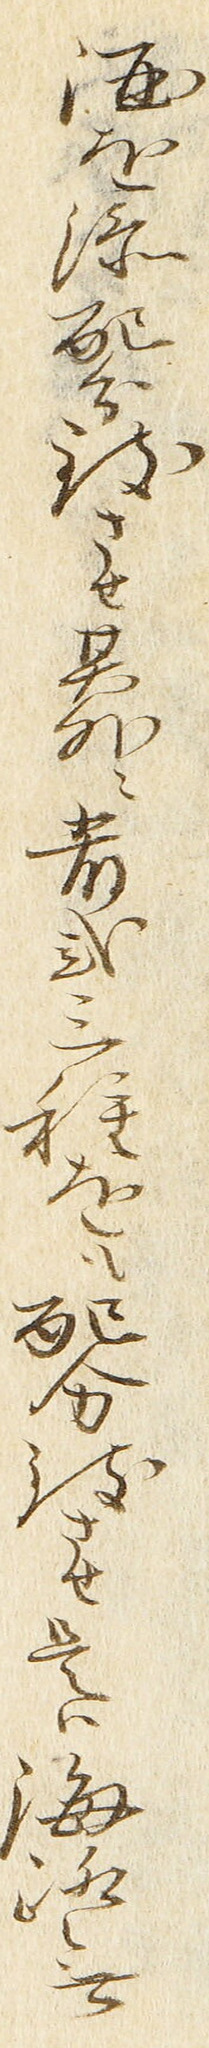酒を添配分致させ其外に肴弐三種をを致させ是は海路之無
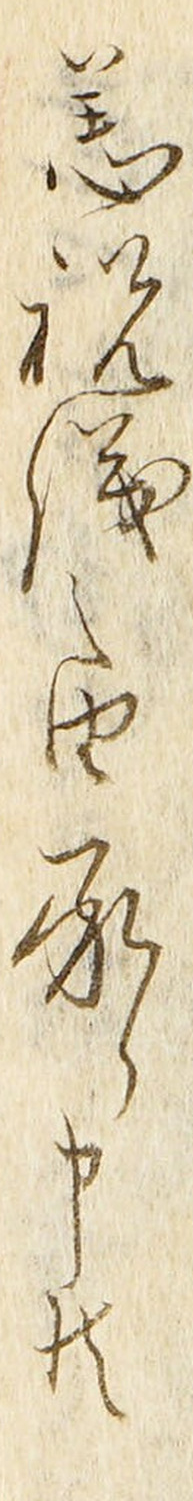恙祝儀之由承り申候
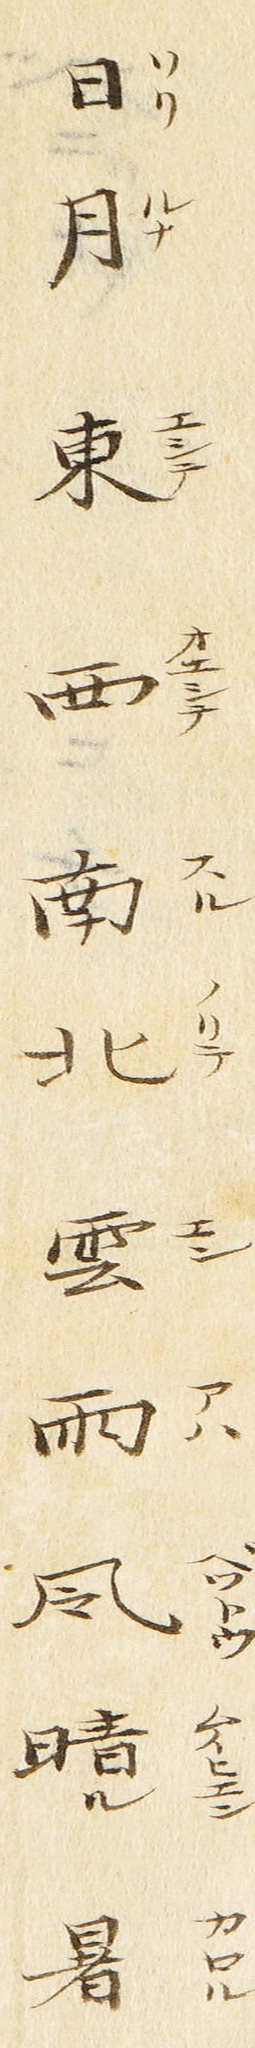日月東西南北雲雨風晴る暑
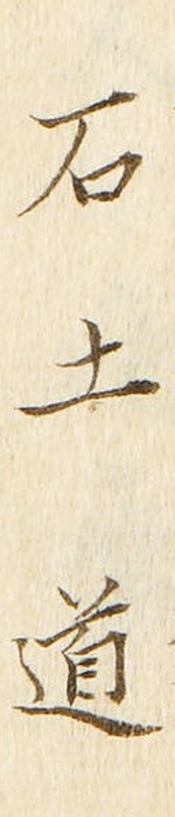石土道
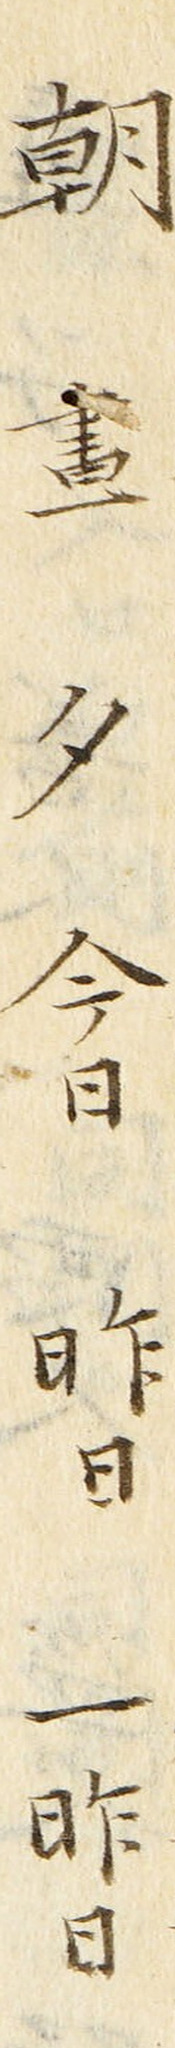朝晝夕今日昨日一昨日

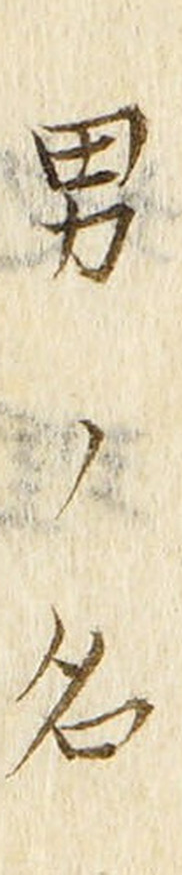男ノ名
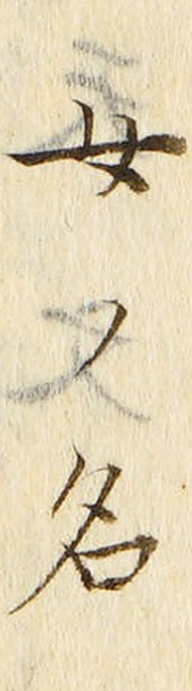男ノ名
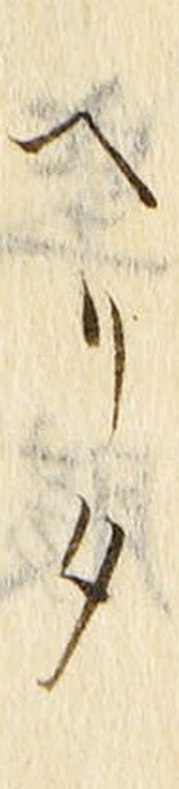ヘリタ
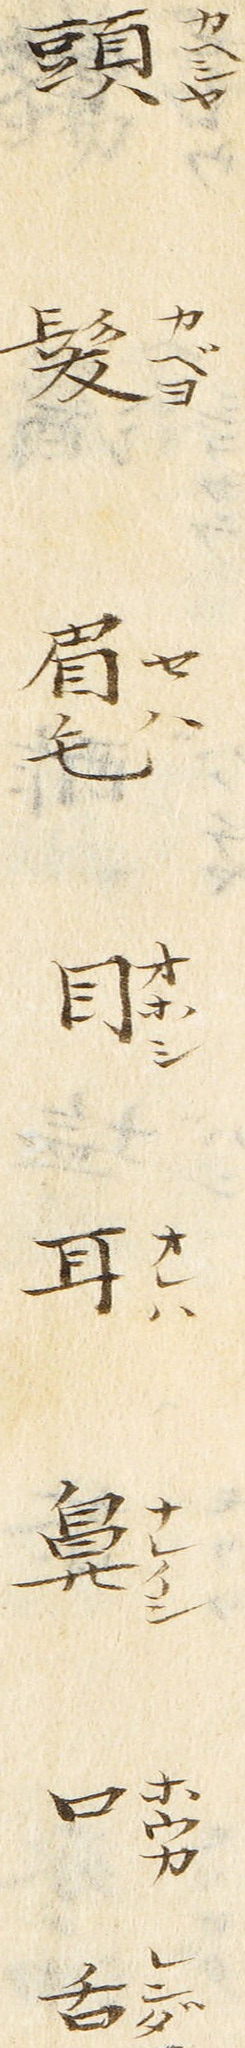頭髪眉毛目耳鼻口舌
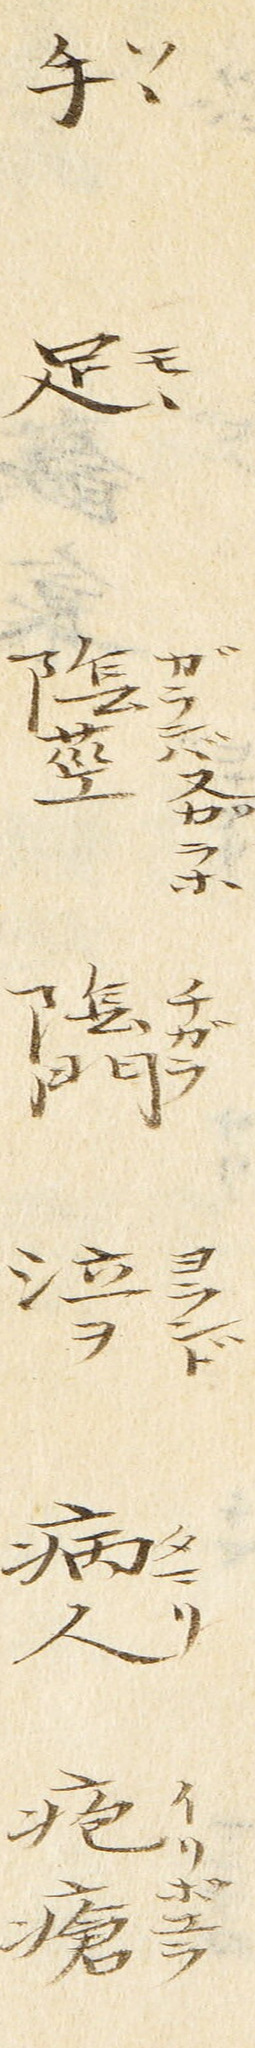手足陰茎陰門泣ヲ病人疱瘡
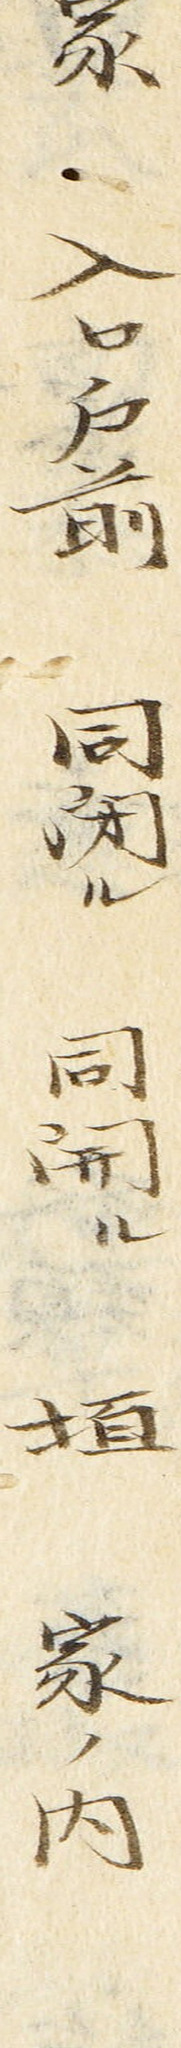家入口戸前同閉る同開る垣家の内䆴

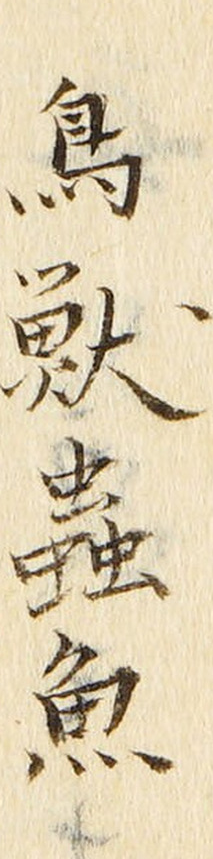鳥獣虫魚
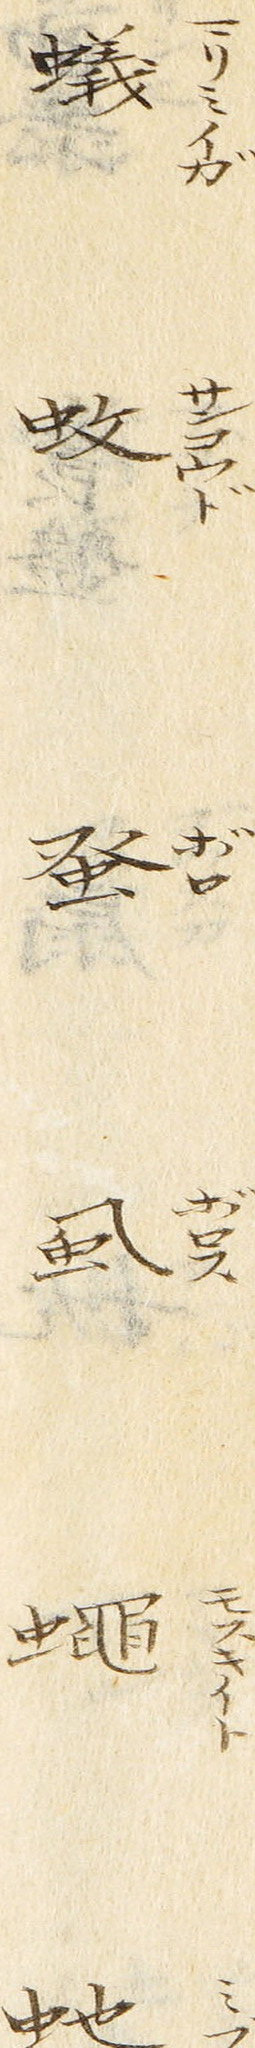蟻蚊蚤虱蠅虵

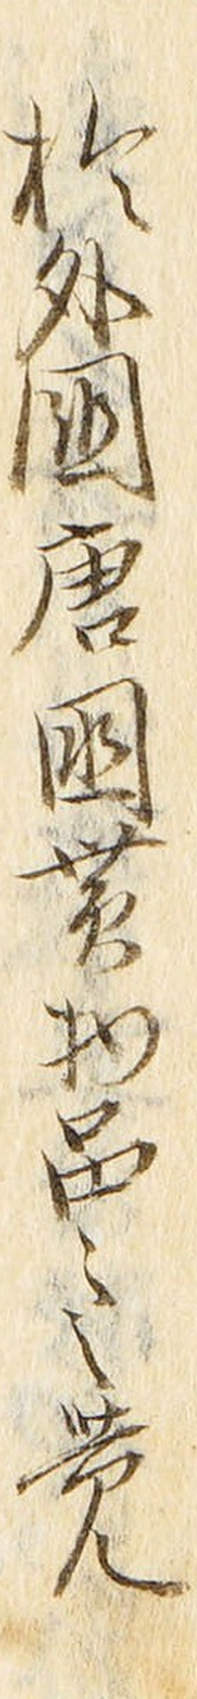於外国唐国貰物品々之覚
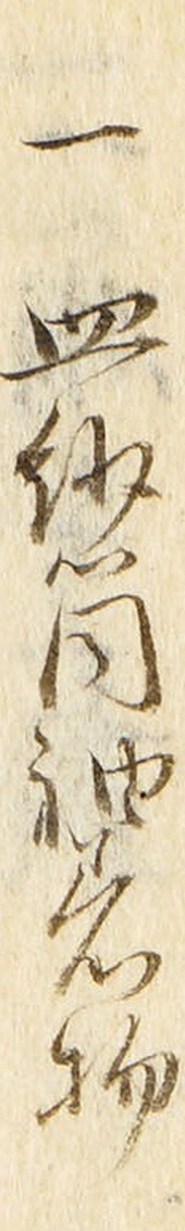一皿紗筒袖着物
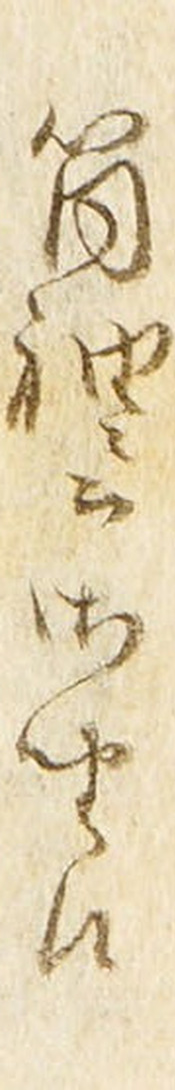筒袖に而御座候
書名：長崎漂流記
